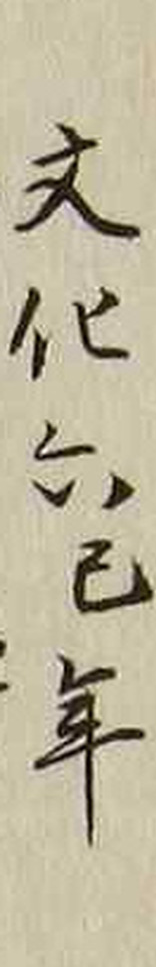文化六巳年
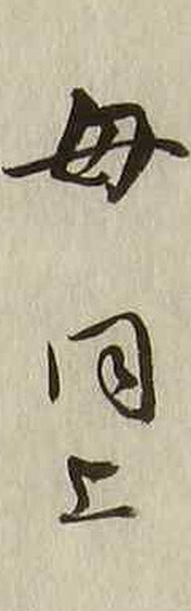母同上
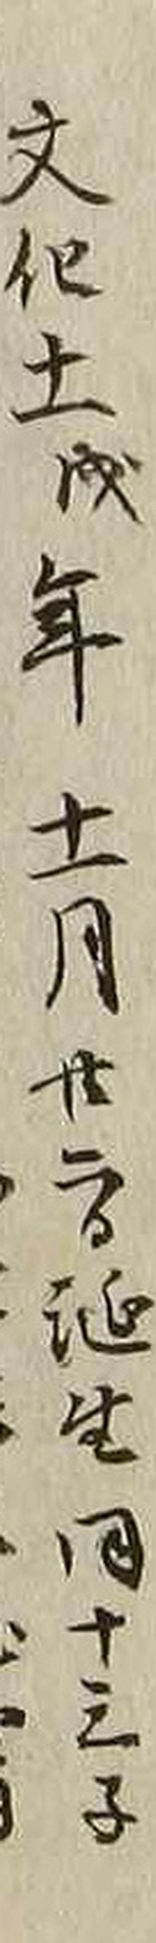文化十一戌年十一月廿二日誕生同十三子
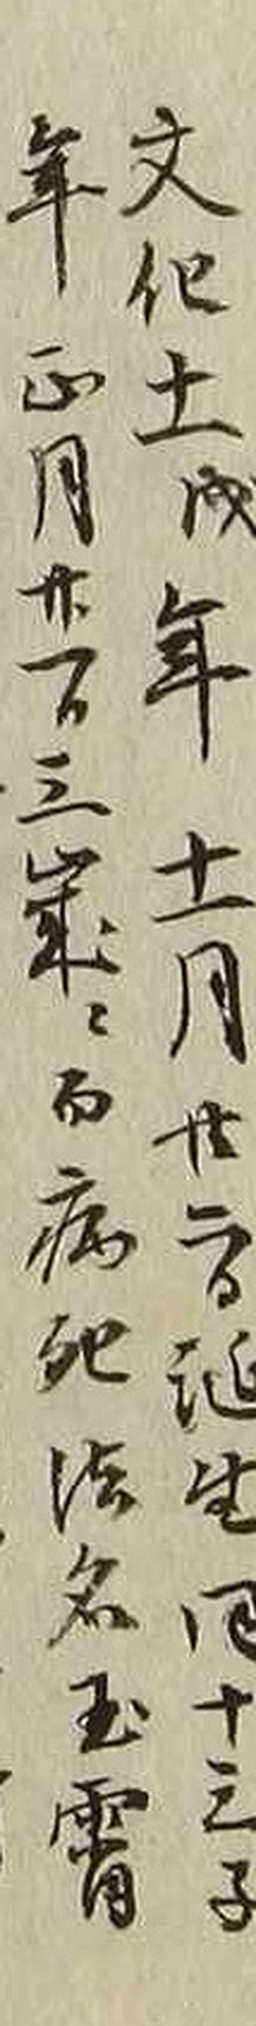女年正月廿一日三歳ニて病死法名玉霜
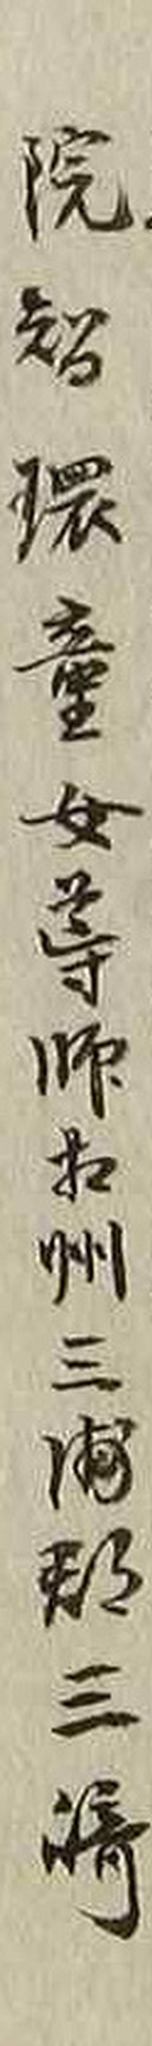院智環童女導師相州三浦郡三崎
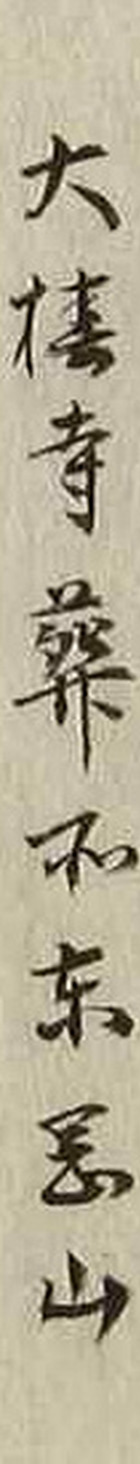大椿寺葬所東岡山
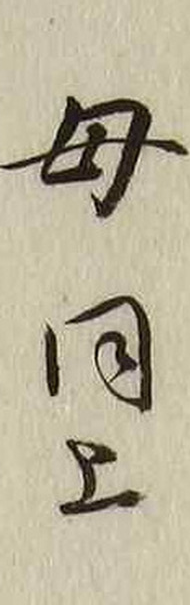母同上
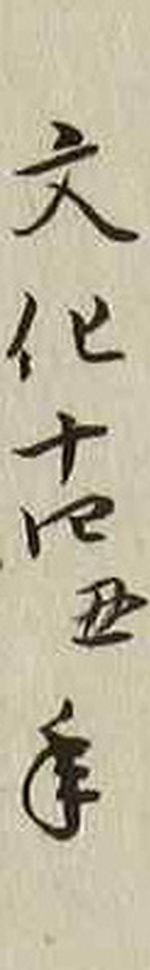文化十四丑年
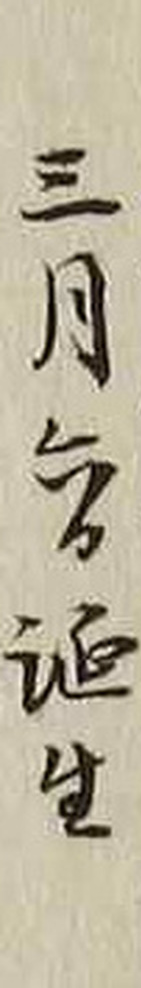三月六日誕生
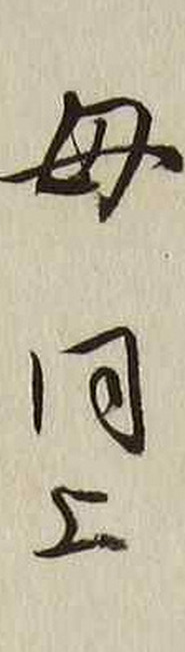母同上
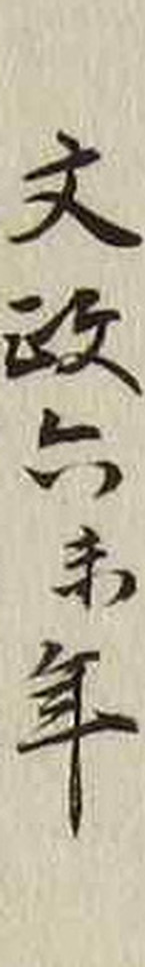文化六未年
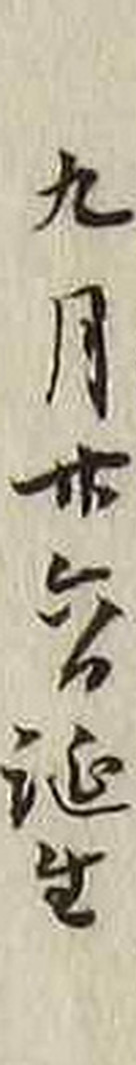九月廿六日た誕生
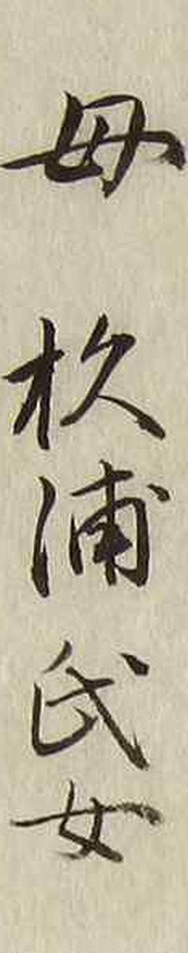母杉浦氏女

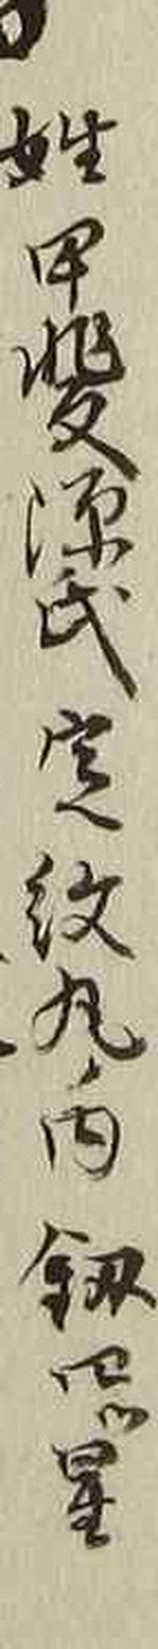姓甲斐源氏定紋丸ノ内剱四ッ星
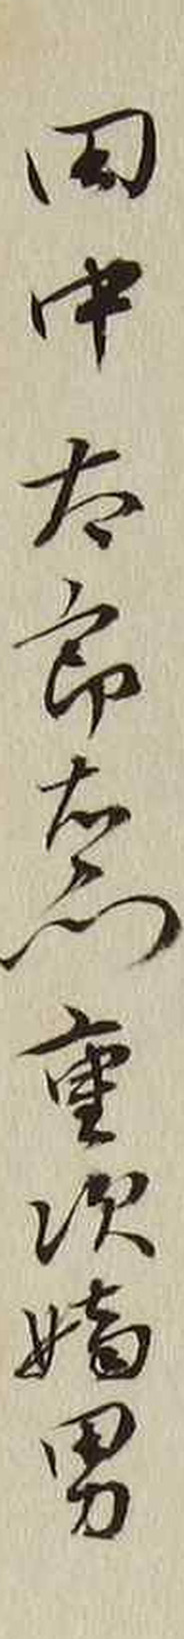田中太郎右衛門重次嫡男
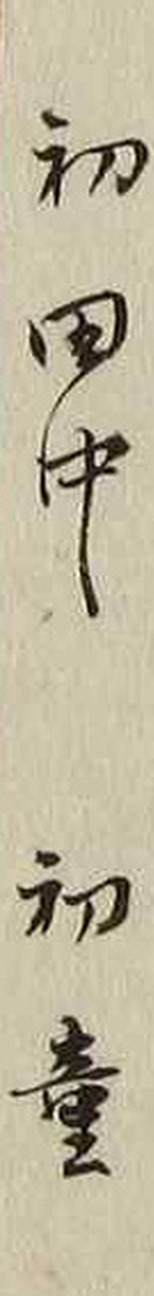初田中初童
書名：諸士系譜　巻之16　い之部16
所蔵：会津若松市立会津図書館
